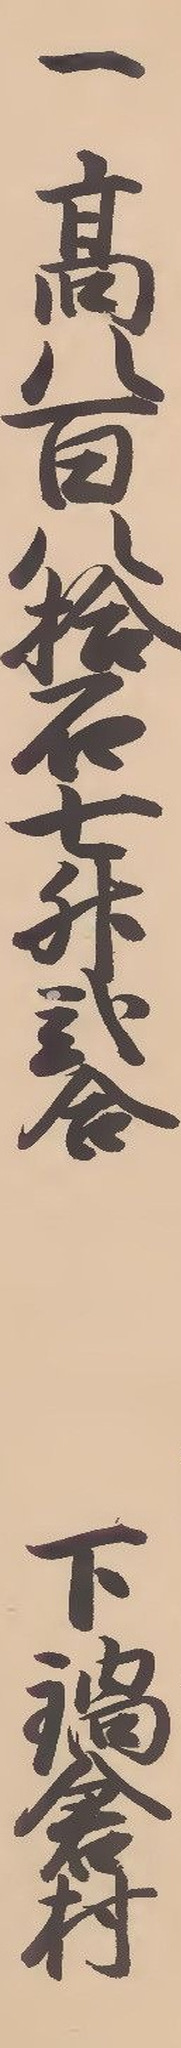一高八百八拾石七升弐合下鍋倉村
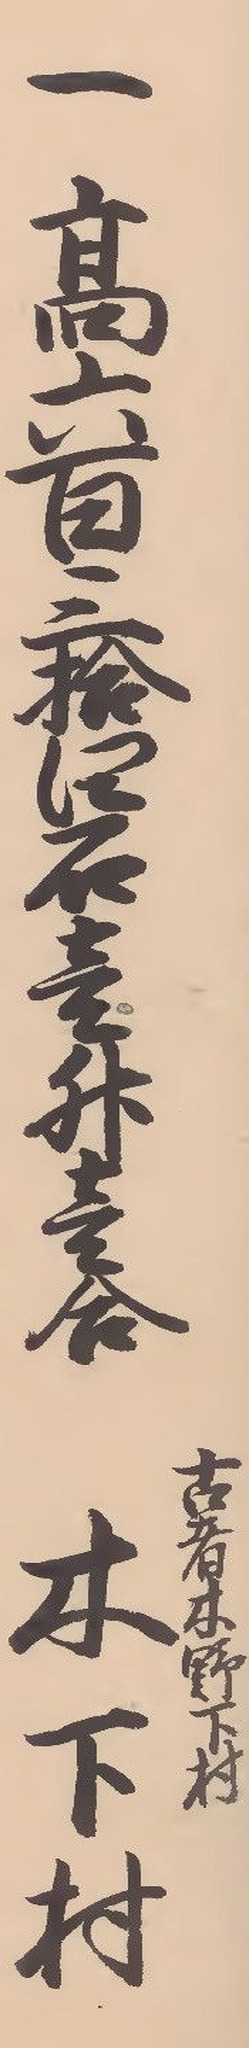一高六百三拾四石壱升壱合木下村
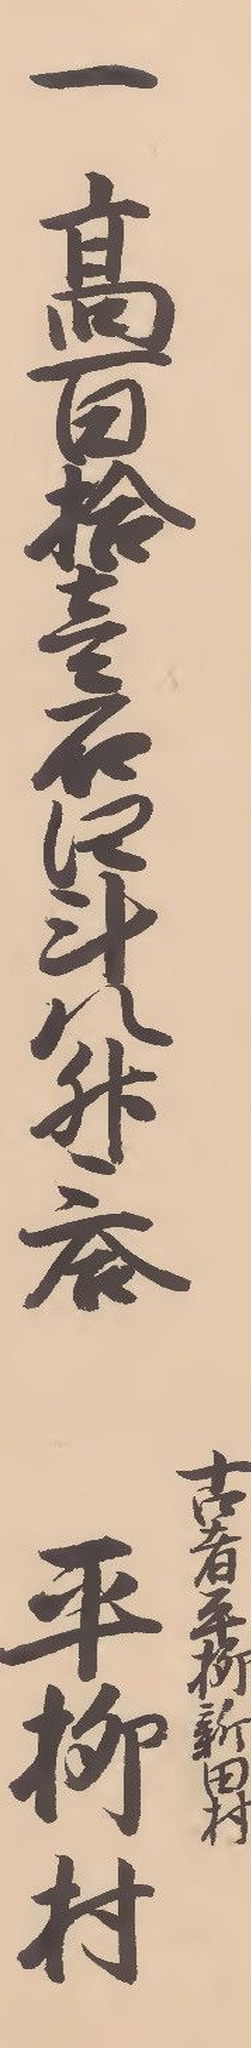一高百拾壱石四斗八升三合平柳村
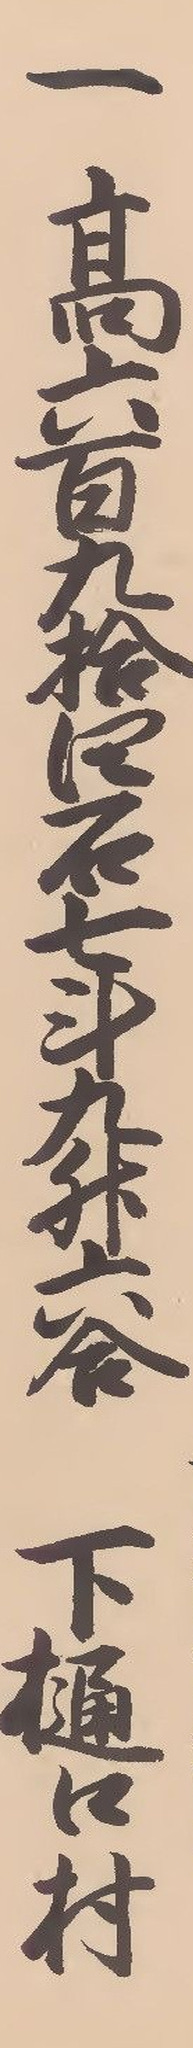一高六百九拾四石七斗九升六合下樋口村
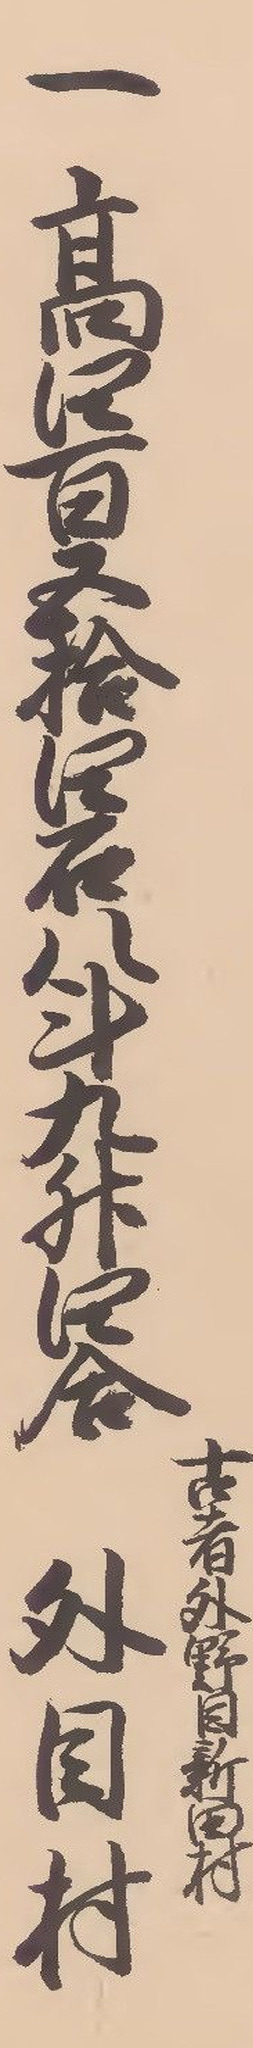一高四百五拾四石八斗九升四合外目村

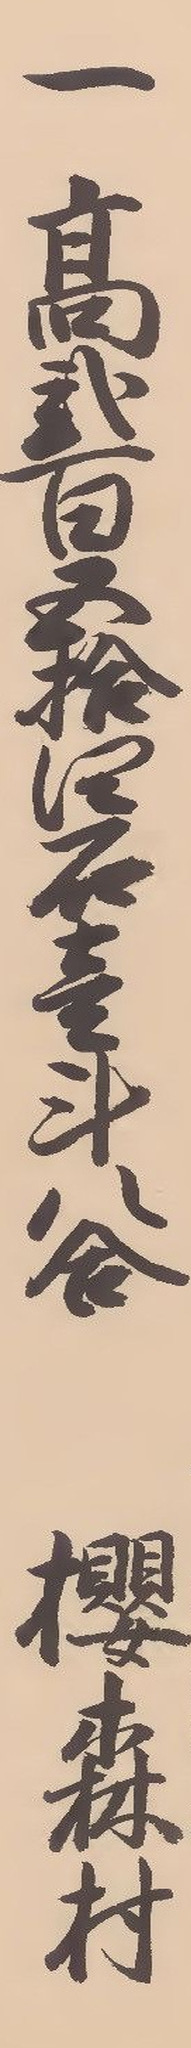一高弐百五拾四石壱斗八合桜森村
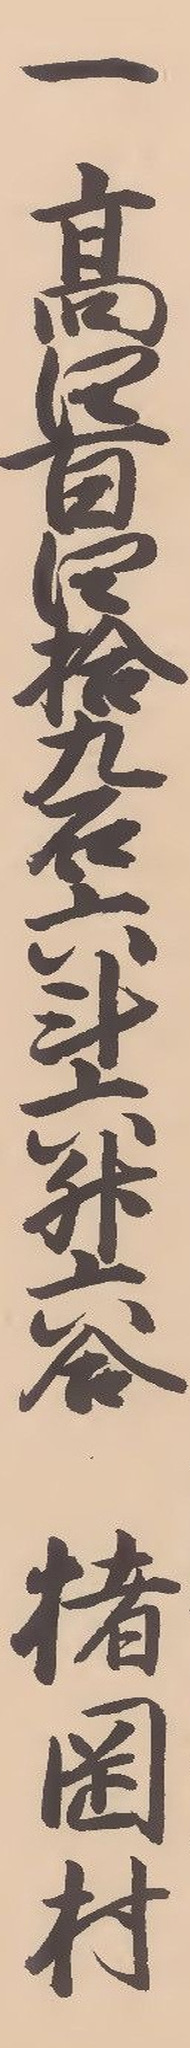一高四百四拾九石六斗六升六合猪岡村
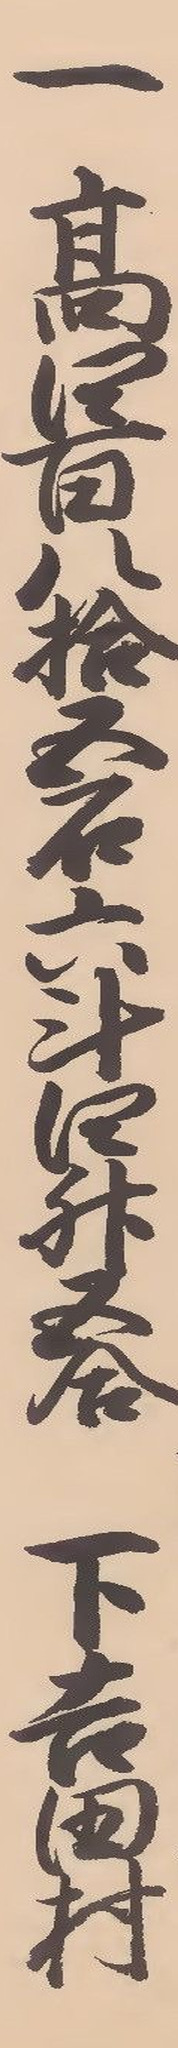一高四百八拾五石六斗四升五合下吉田村
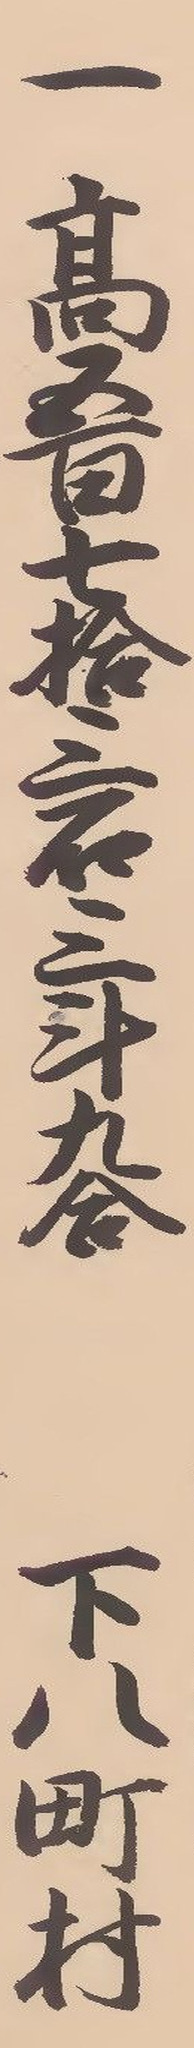一高五百七拾三石三斗九合下八町村
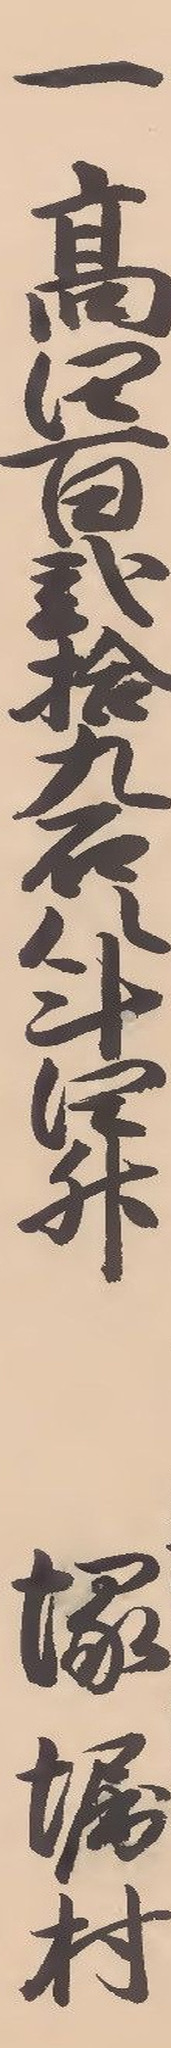一高四百弐拾九石八斗四升塚堀村
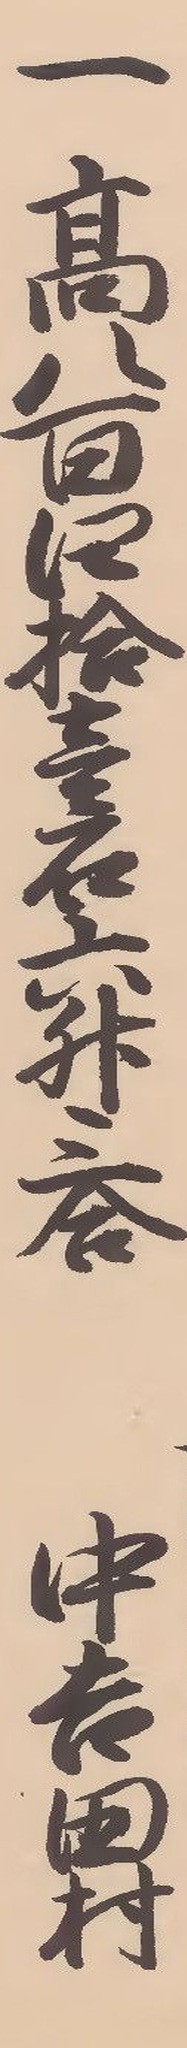一高八百四拾壱石六升三合中吉田村
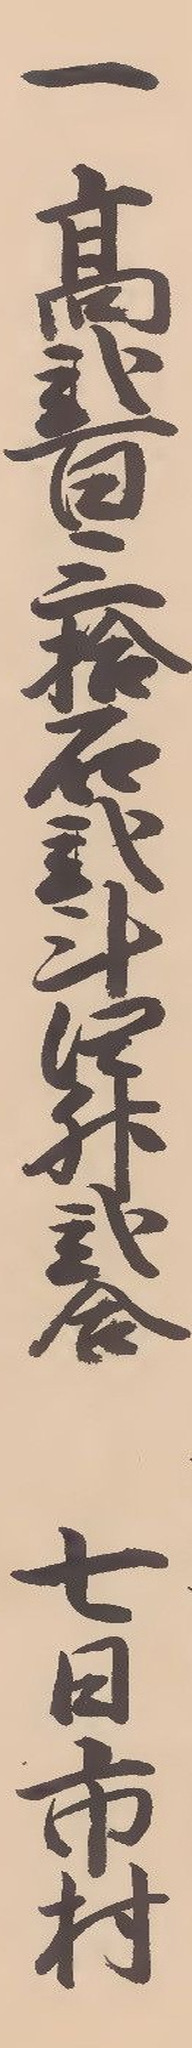一高弐百三拾石弐斗四升弐合七日市村
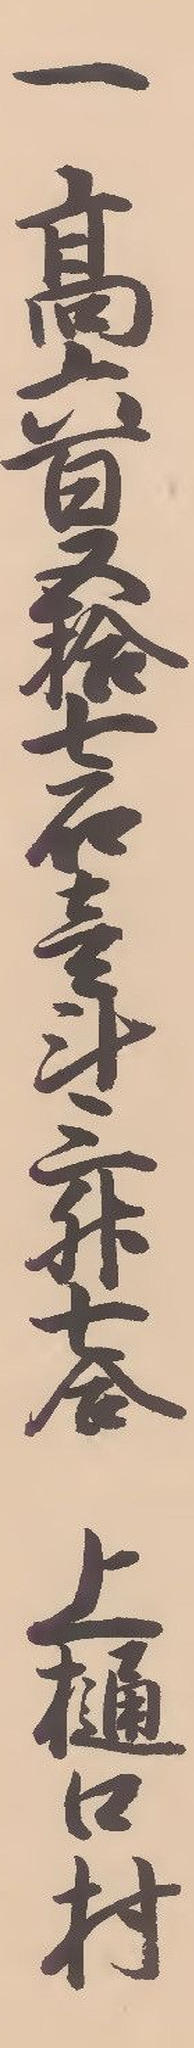一高六百五拾七石壱斗三升七合上樋口村

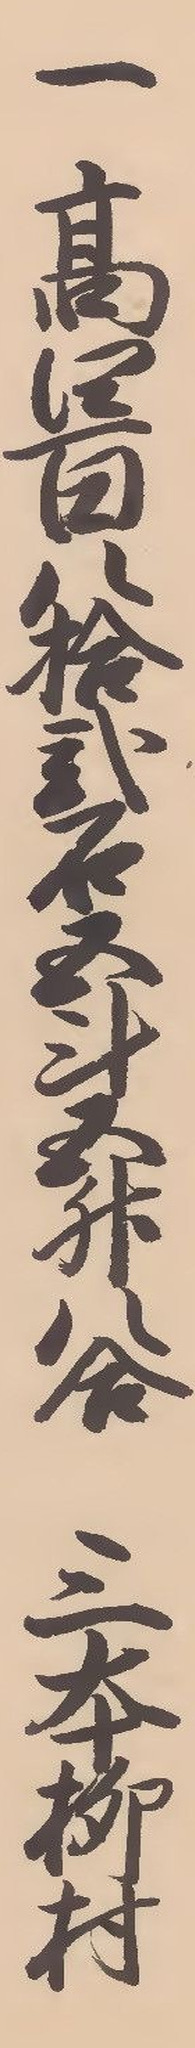一高四百八拾弐石五斗五升八合三本柳村
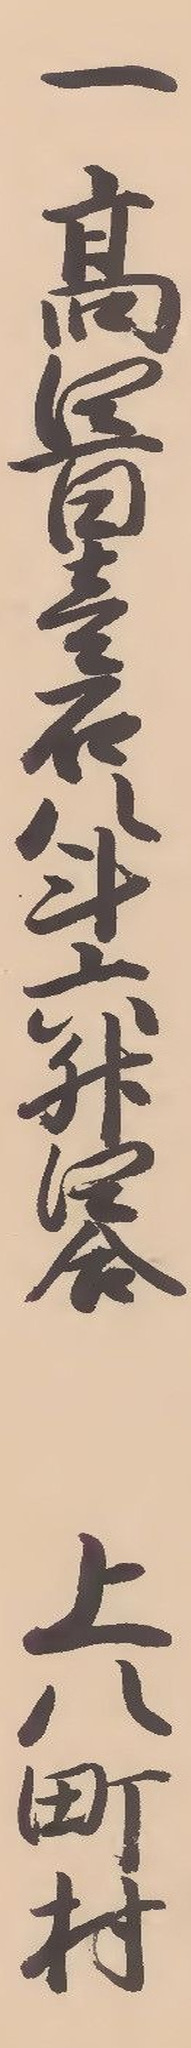一高四百壱石八斗六升四合上八町村
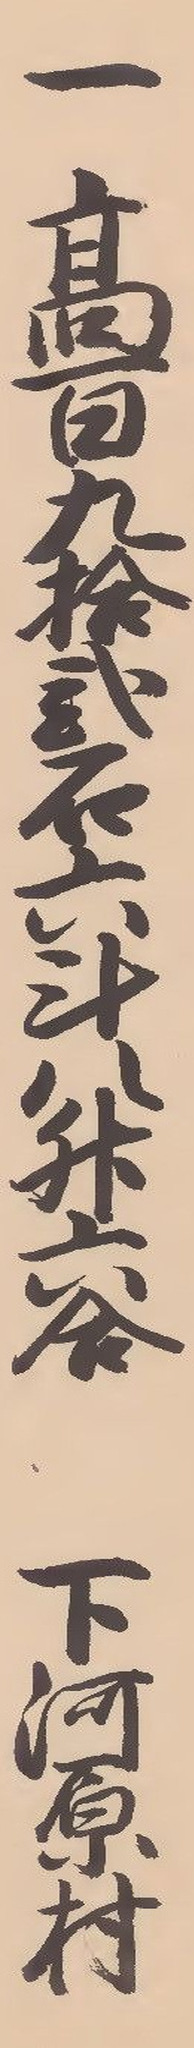一高百九拾弐石六斗八升六合下河原村
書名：出羽国郷帳　５
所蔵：国立公文書館 National Archives of Japan
